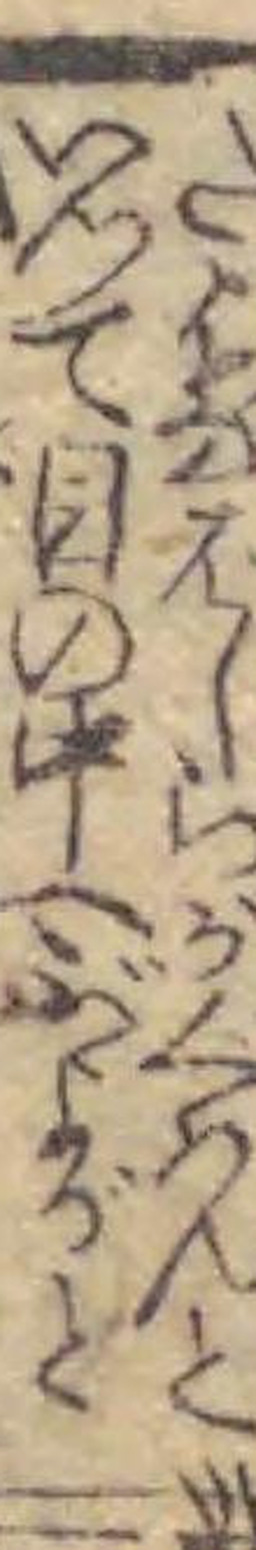いつて目の中へぶよがと
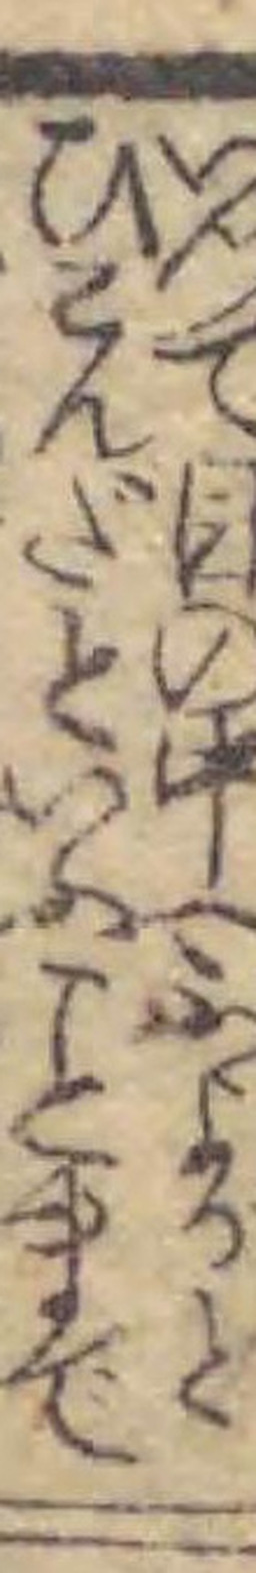ひこんだといふことまで
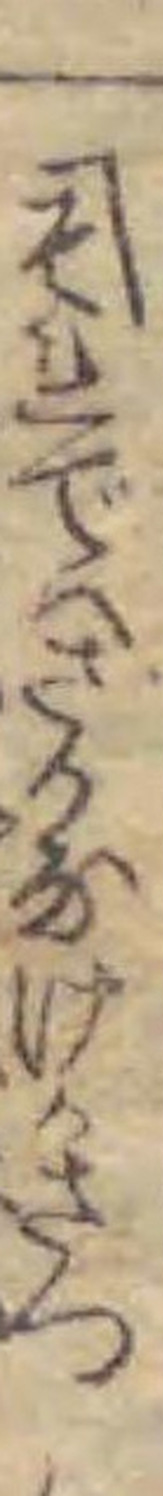〽それではさかなけかさつ
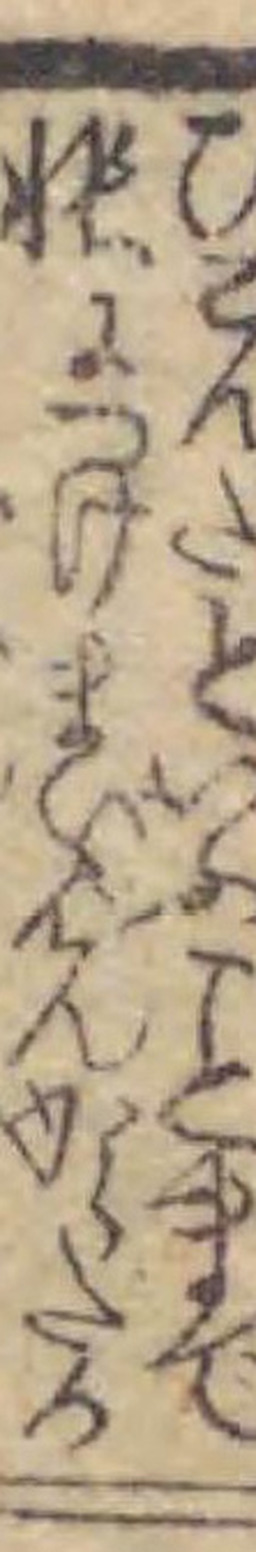帳につけまいんばんからたか
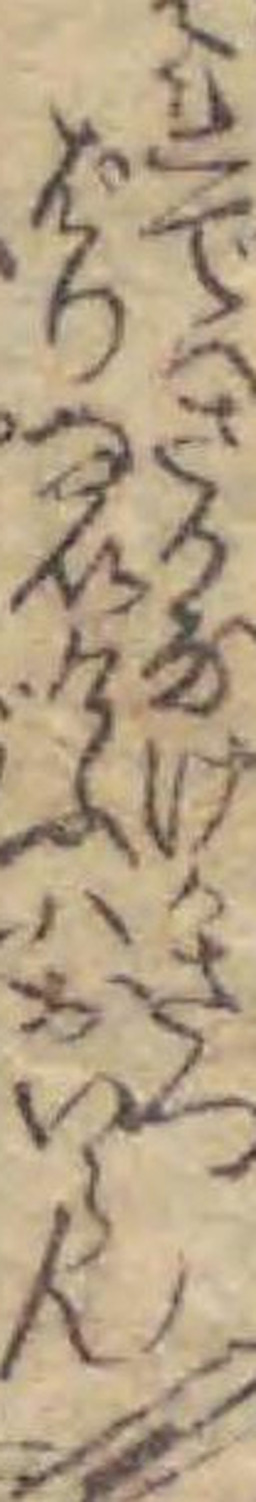ばりないけふはおいらん
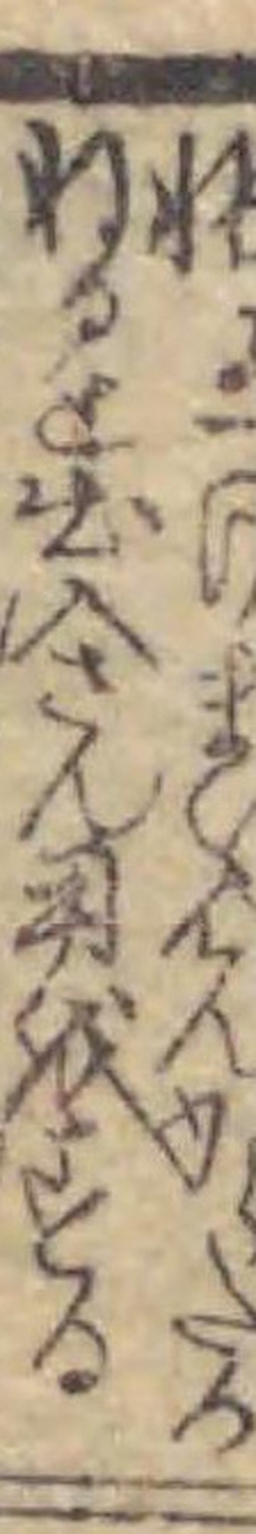ねると出入さん用をする
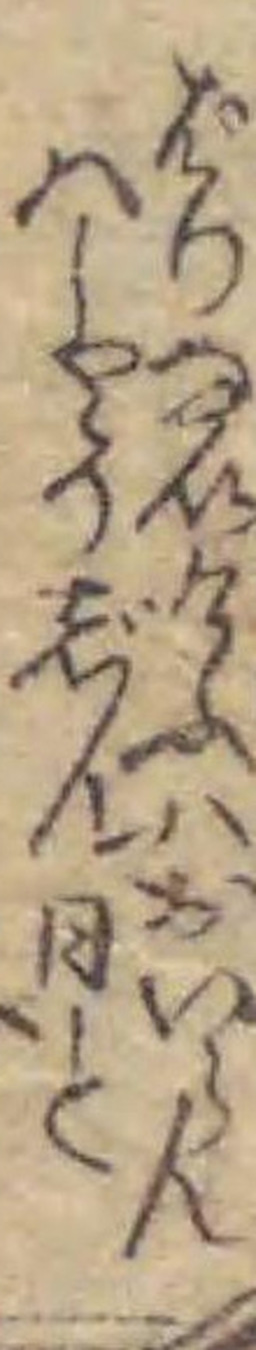はしやうじん日と
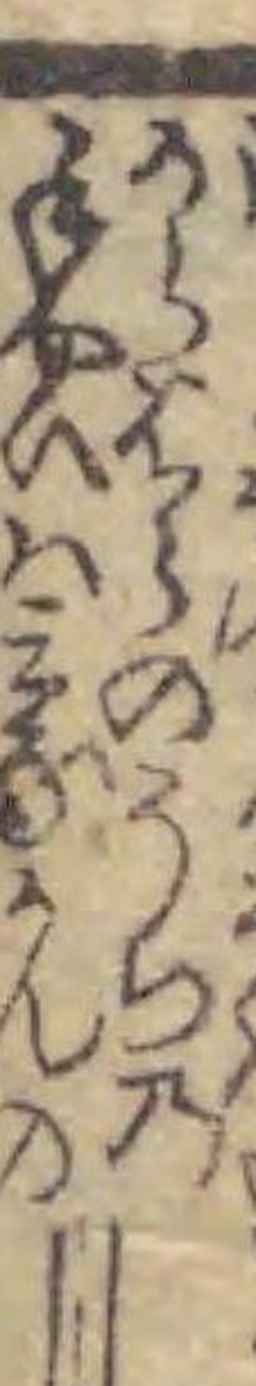手やいはみなかんの
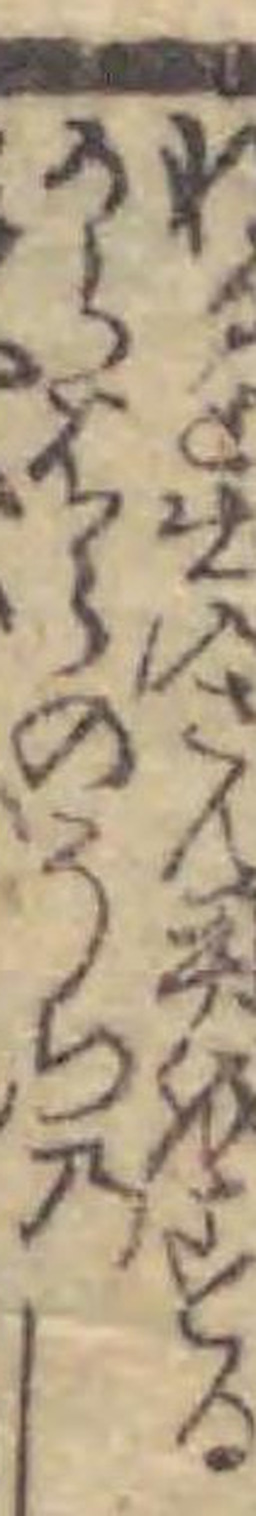からはらのうらの
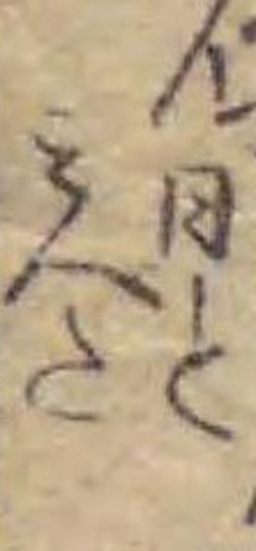みへた
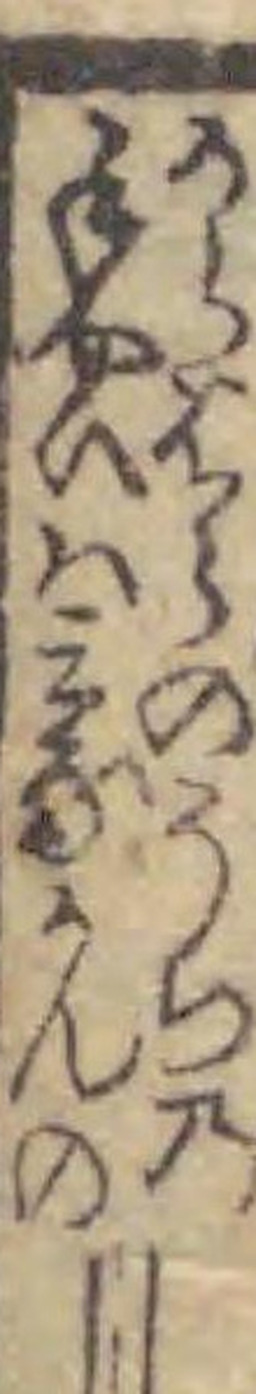手やいはみなかんの
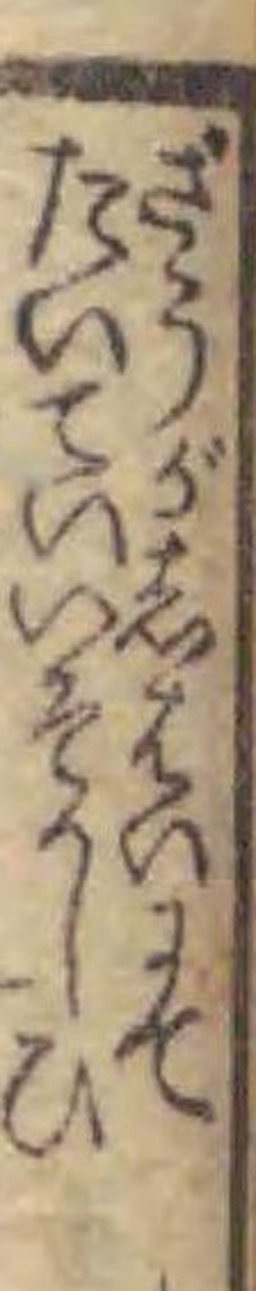たいていいそかしひ
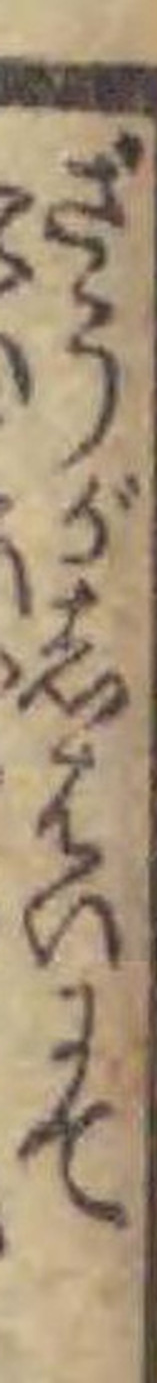ざうがしはいにて
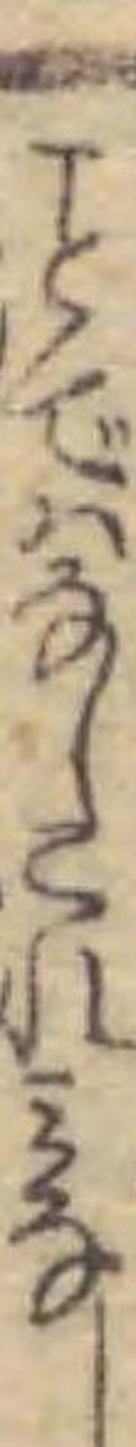ことではなしこれみな
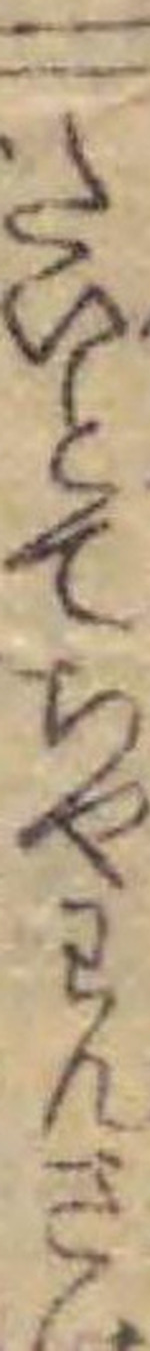たいとてちやわんさけ
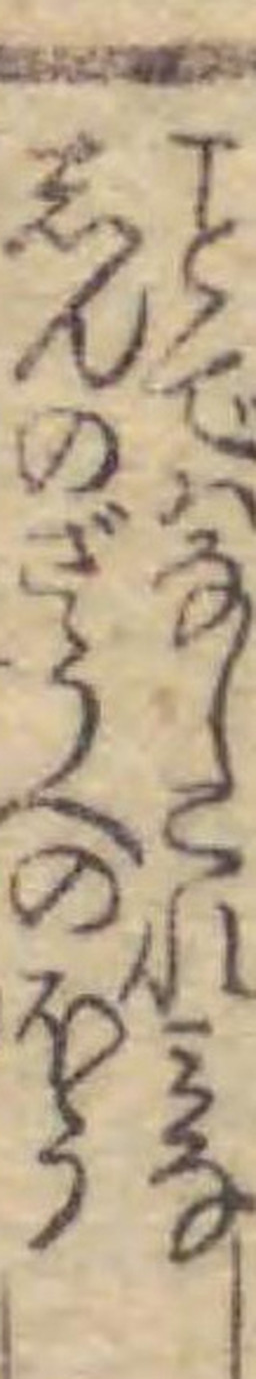しんのざうへのほう
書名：十四傾城腹之内 : 3巻
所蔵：国立国会図書館 National Diet Library, JAPAN
